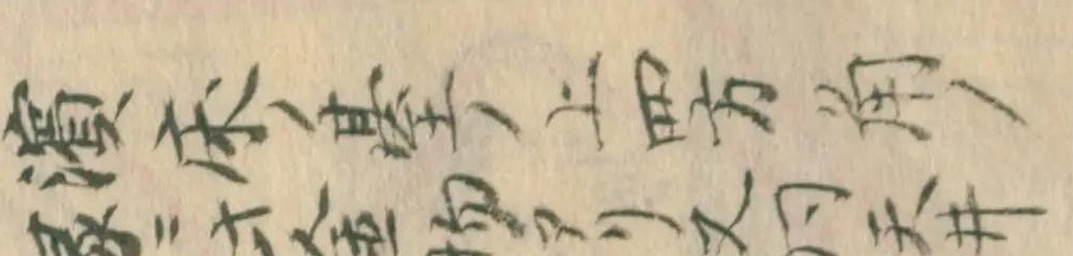浜床ノ台ノ上四方角ノ
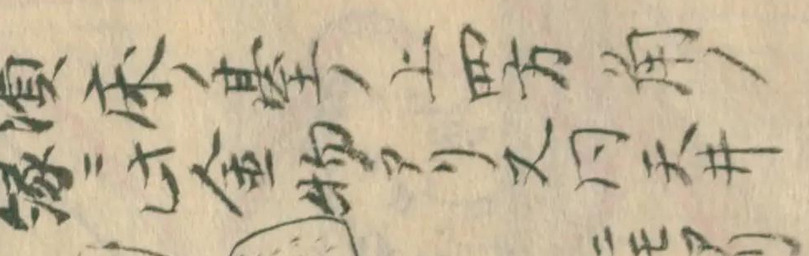縁ニ此金物アリ又同天井

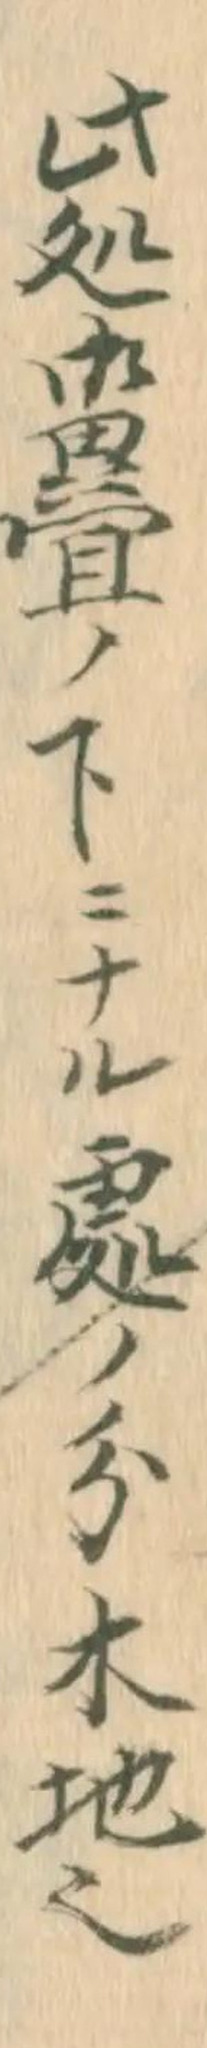此処御畳ノ下ニナル処ノ分木地也
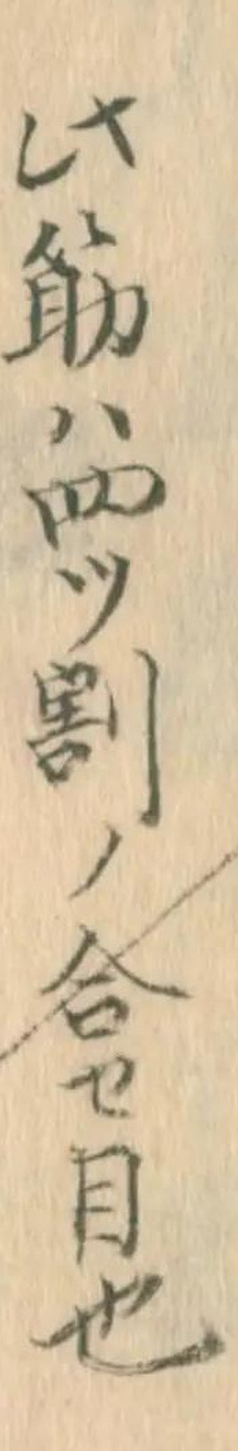此筋ハ四ツ割ノ合セ目也
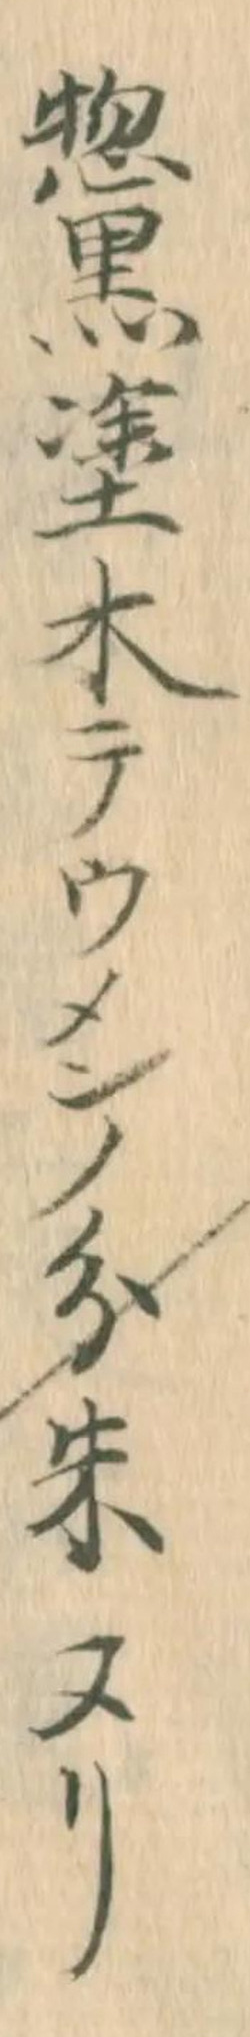惣黒塗木テウメンノ分朱ヌリ
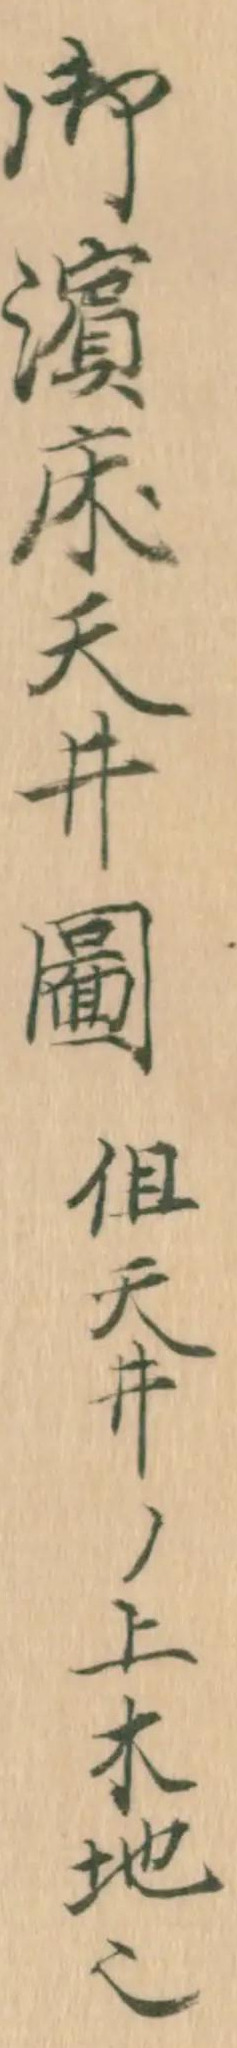御浜床天井図但天井ノ上木地也
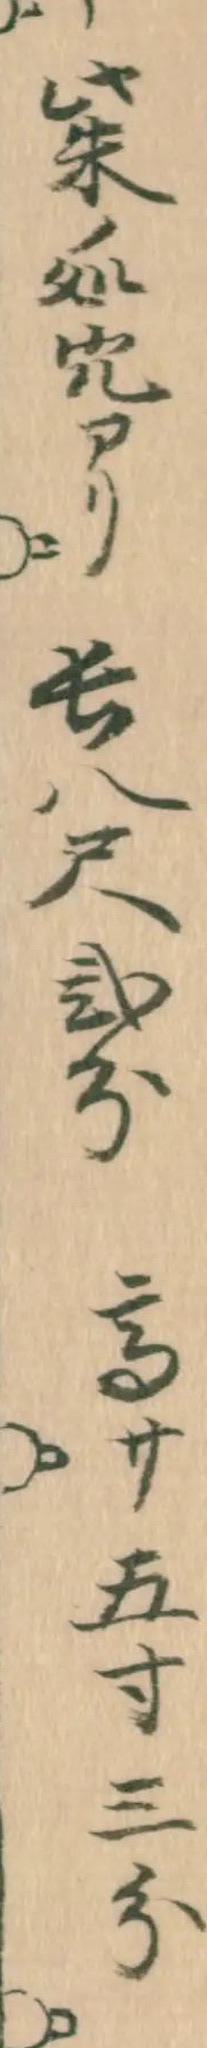此朱ノ処穴アリ長八尺弐分高サ五寸三分
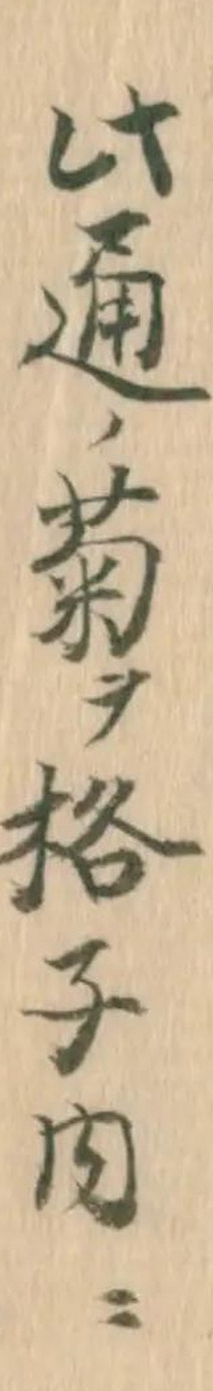此通ノ菊ヲ格子内ニ
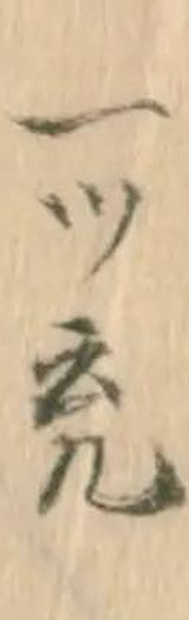一ツ充
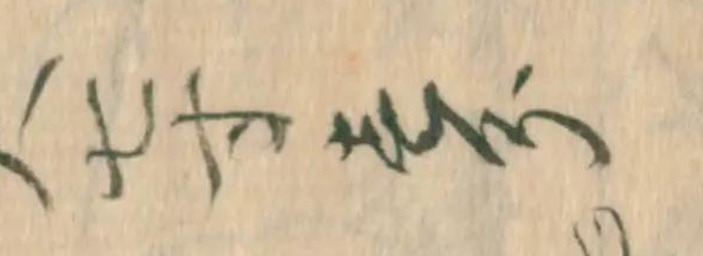横四尺七寸壱分
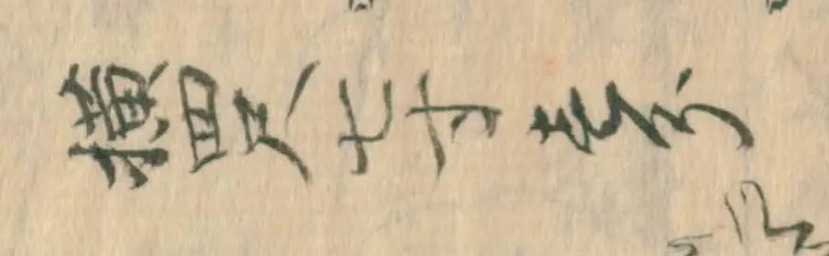横四尺七寸壱分
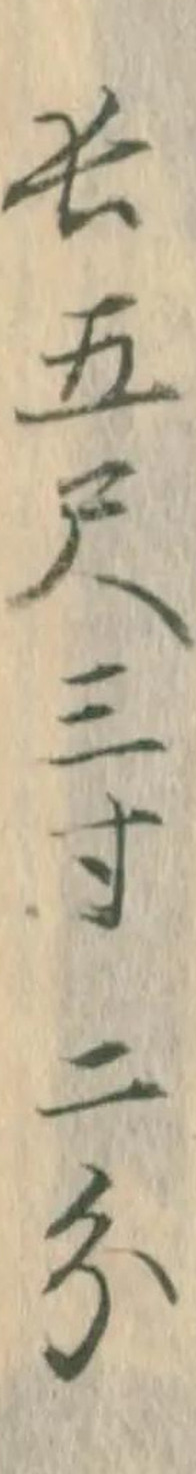長五尺三寸二分
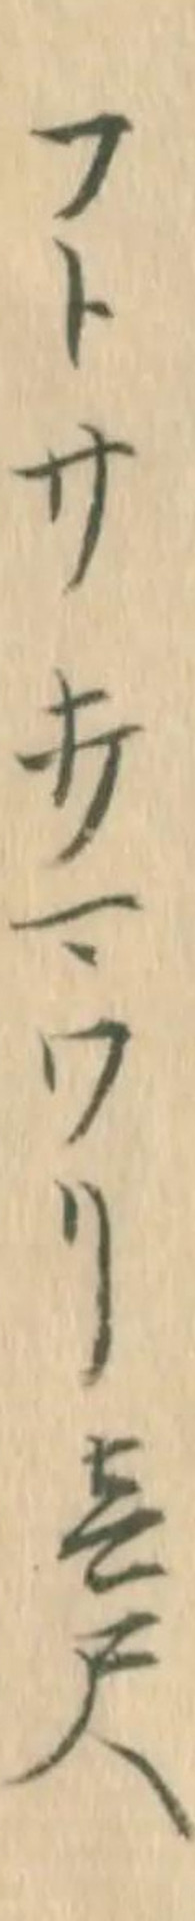フトサ打マワリ壱尺

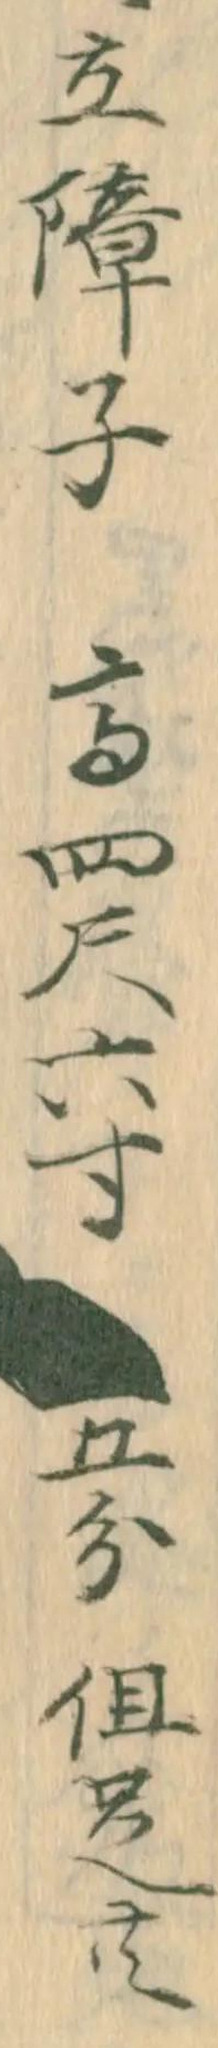御衝立障子高四尺六寸五分但足共
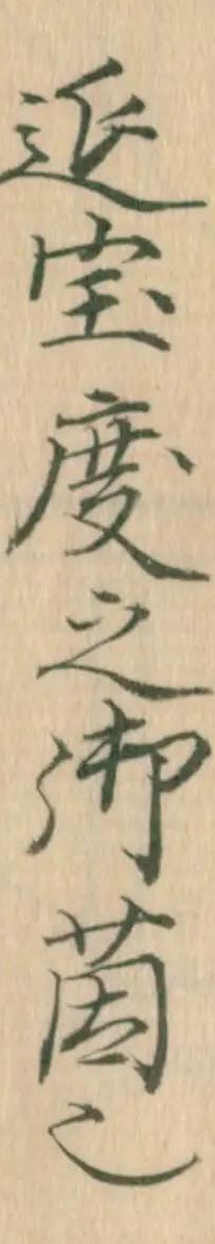延宝度之御茵也
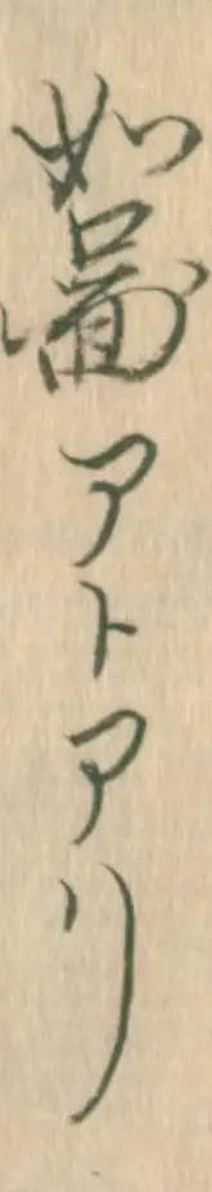如図アトアリ
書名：賀茂社記録. 第15冊
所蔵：国立国会図書館 National Diet Library, JAPAN
